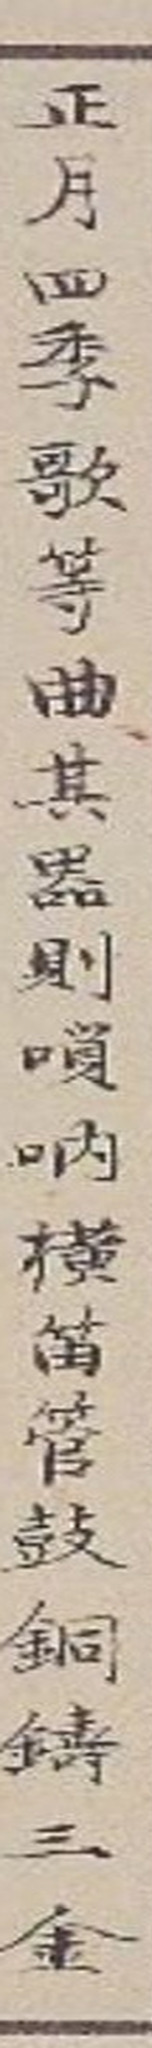正月四季歌等曲、其器則嗩吶横笛管鼓銅鋳三金
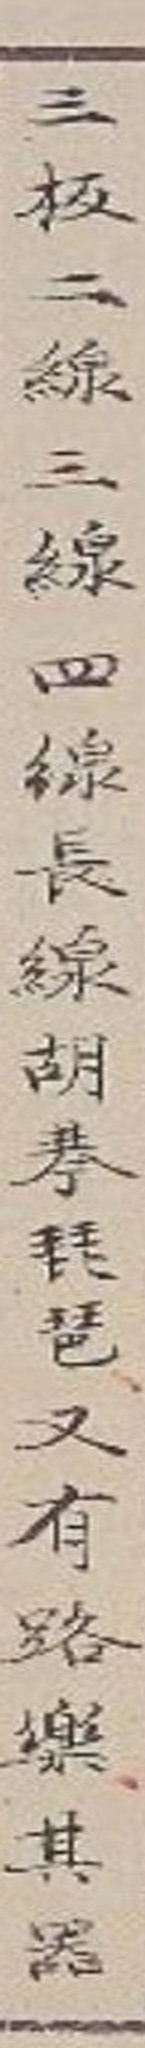三板二線三線四線長線胡琴琵琶、又有路楽其器
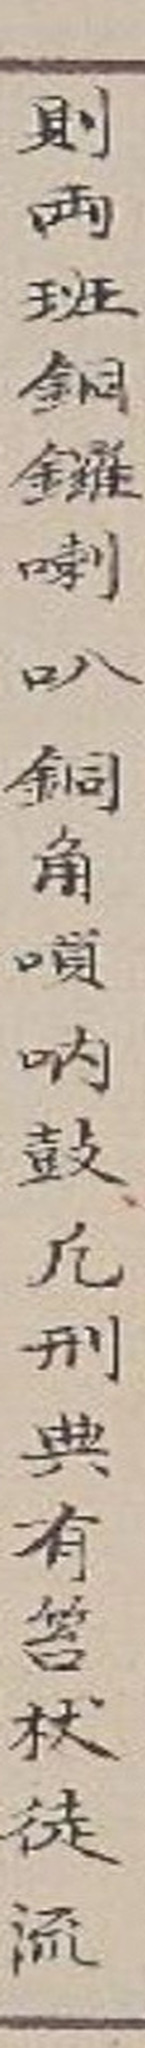則両班銅鑼喇叭銅角嗩吶鼓、凡刑典有笞杖徒流
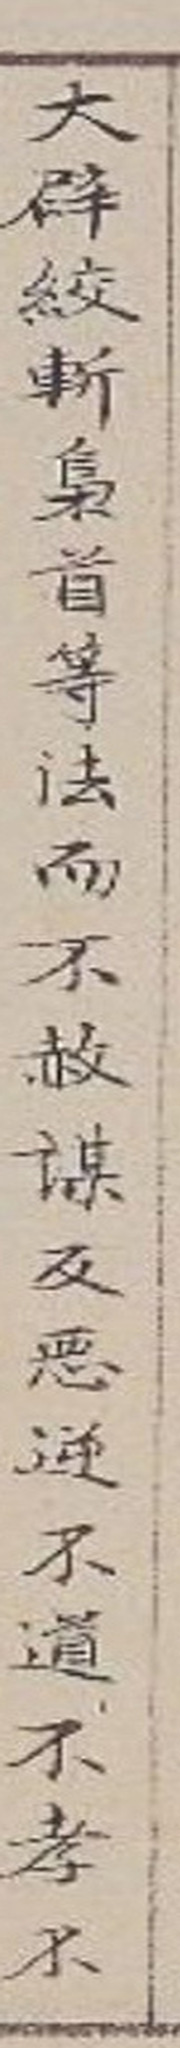大辟絞斬梟首等法而不赦謀反悪逆不道不孝不
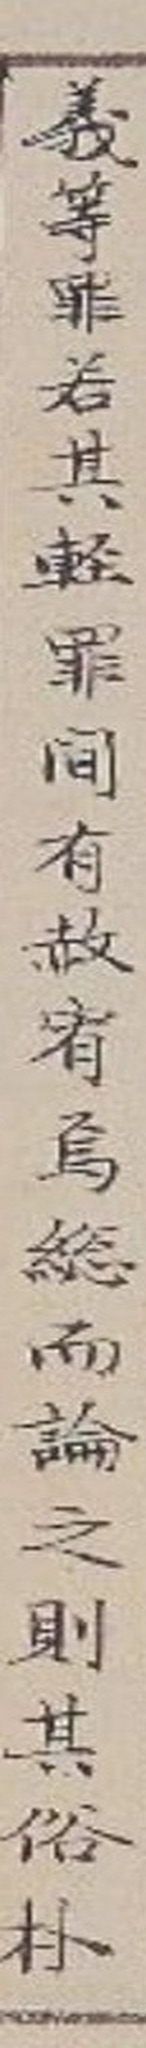義等罪若其軽罪間有赦宥焉総而論之則其俗朴
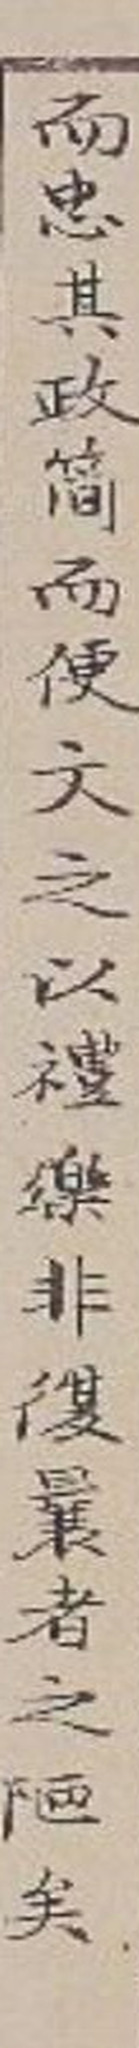而忠其政簡而便文之以礼楽非復曩者之陋矣
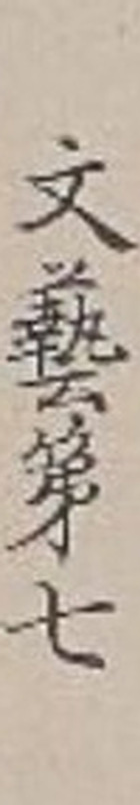文芸第七
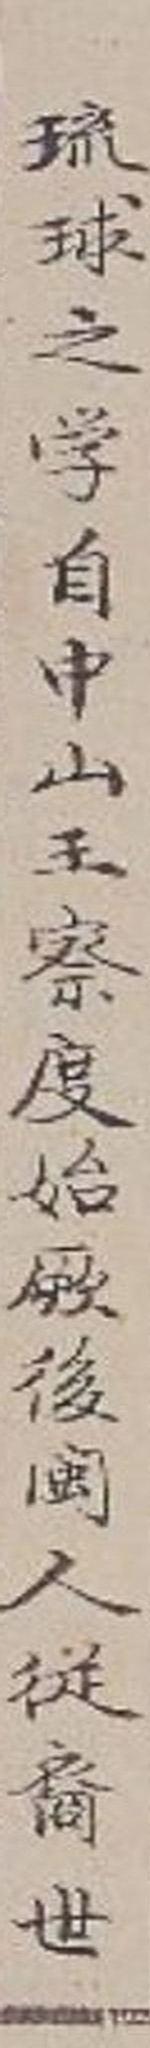琉球之学自中山王察度始厥後閩人従裔世

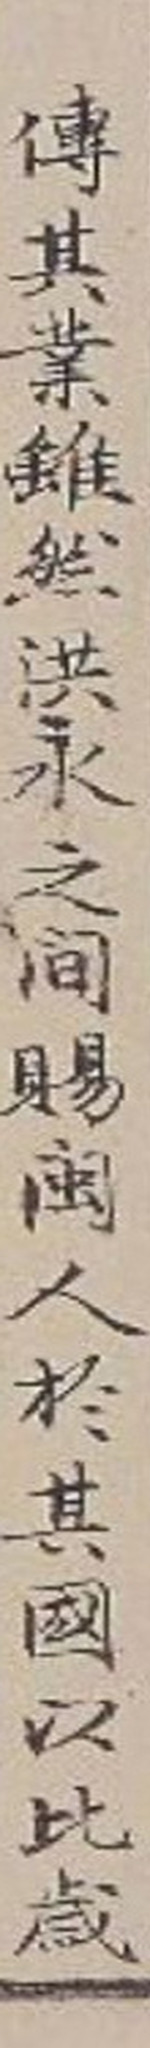伝其業雖然洪永之間賜閩人於其国以比歳
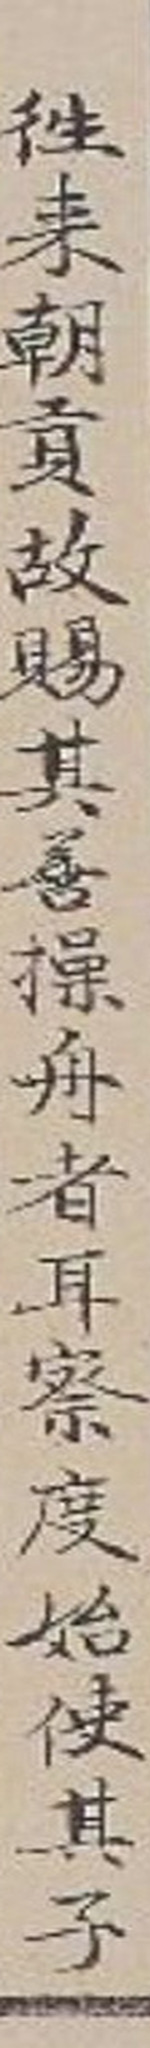往来朝貢故賜其善操舟者耳察度始使其子
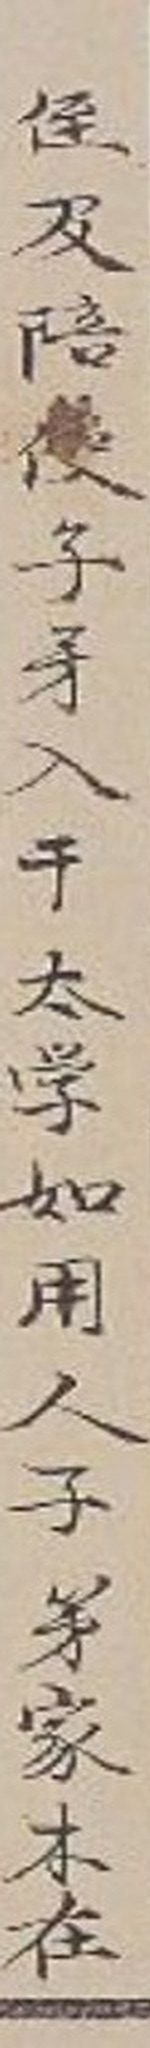侄及陪使子弟入于太学如用人子弟家本在
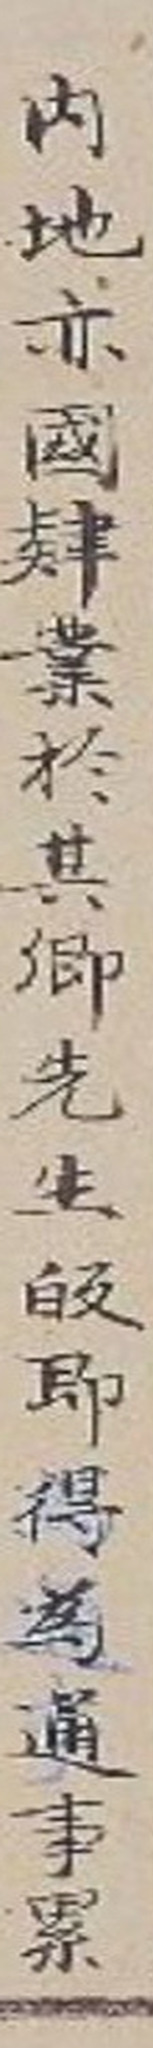内地亦国肄業於其卿先生帰即得為通事累
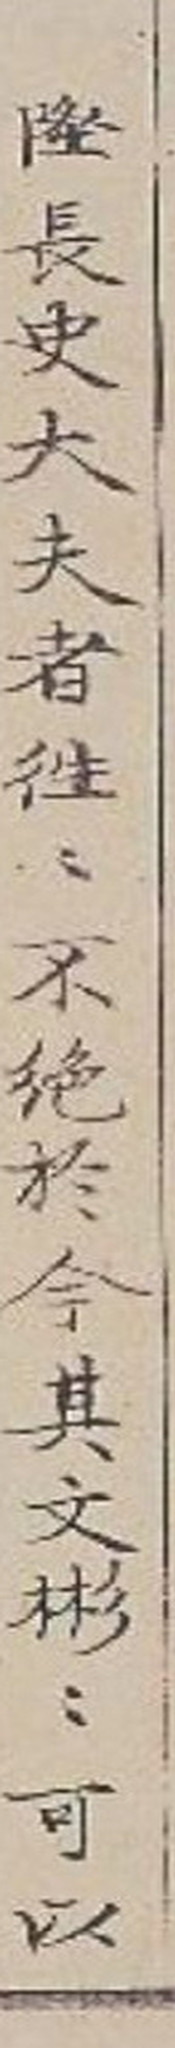陞長史大夫者往々不絶於今其文彬々可以
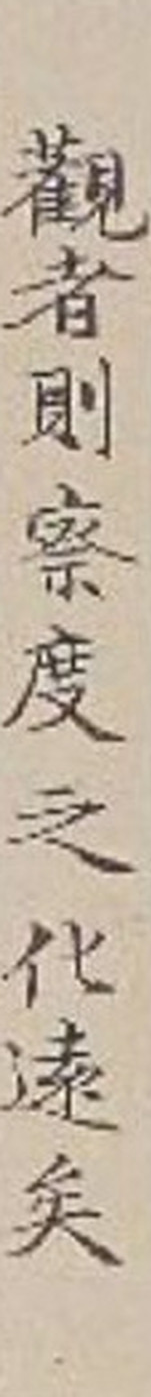観者則察度之化遠矣
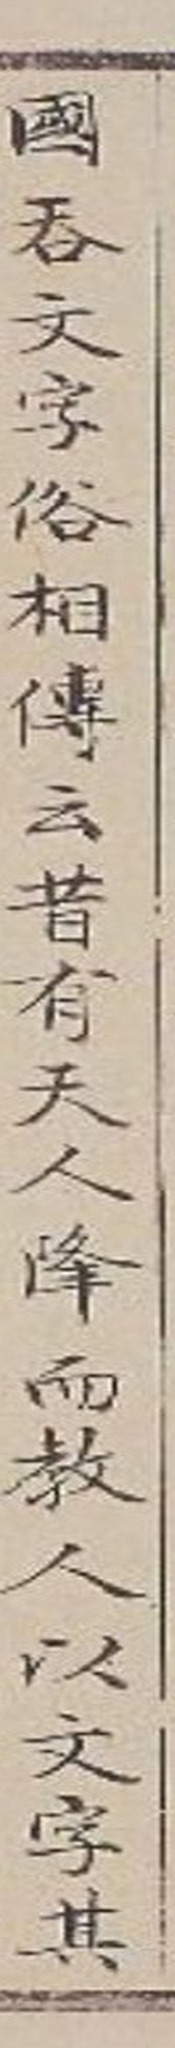国呑文字俗相伝云昔有天人降而教人以文字其
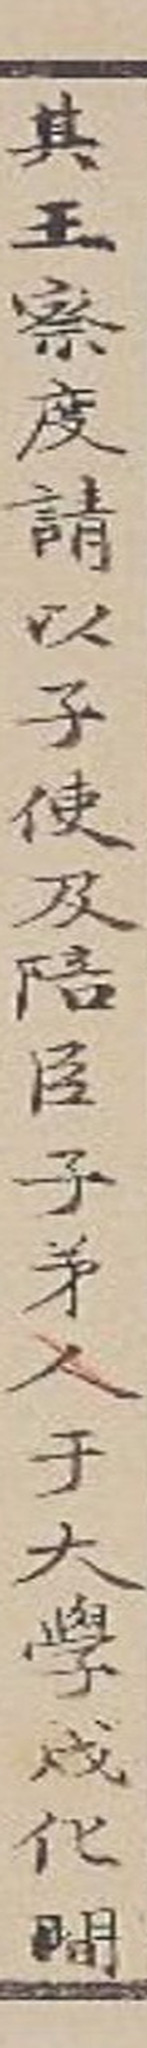其王察度請以子使及陪臣子弟人于大学戍化間
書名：南島志 全
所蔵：University of the Ryukyus Library
